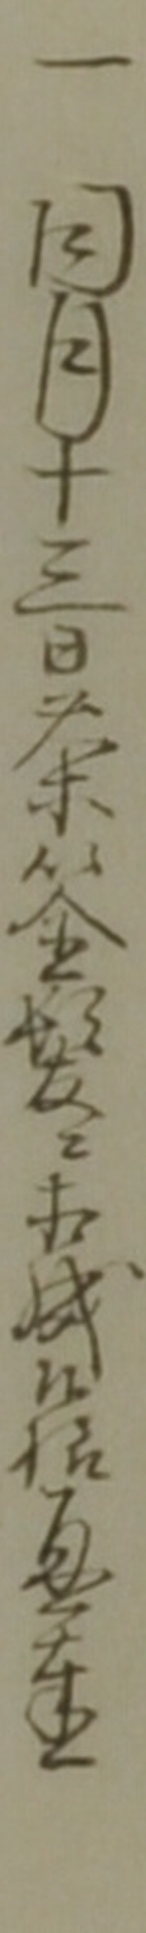一同月十三日茶筌髪ニ相成候様通達
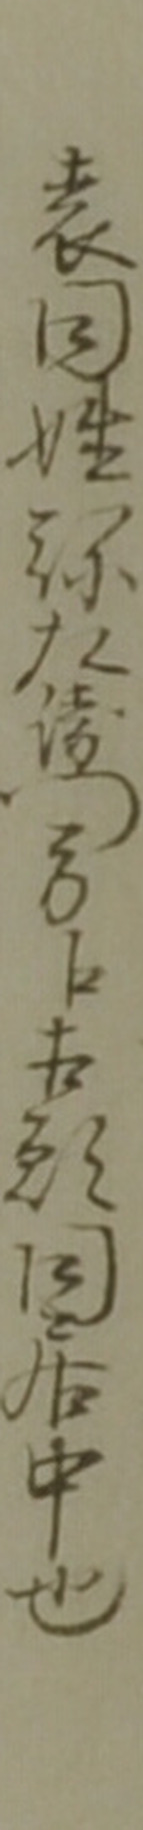表同姓弥左衛門方江相願同居中也
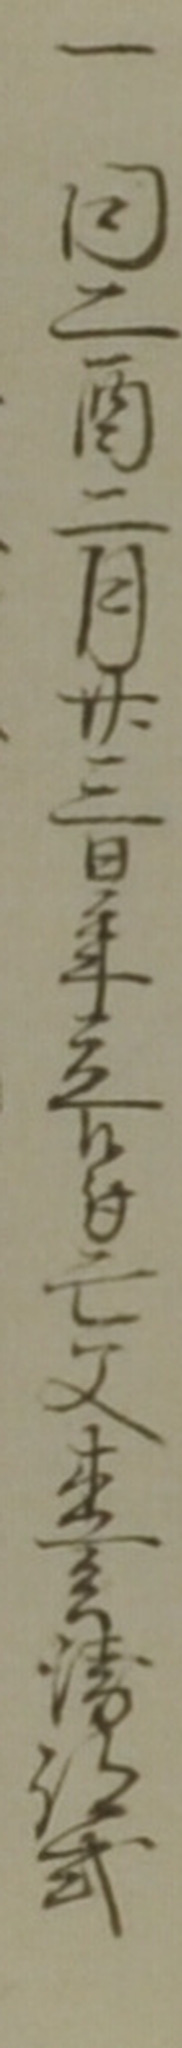一同二酉に月廿三日年立候付亡父杢兵衛跡式
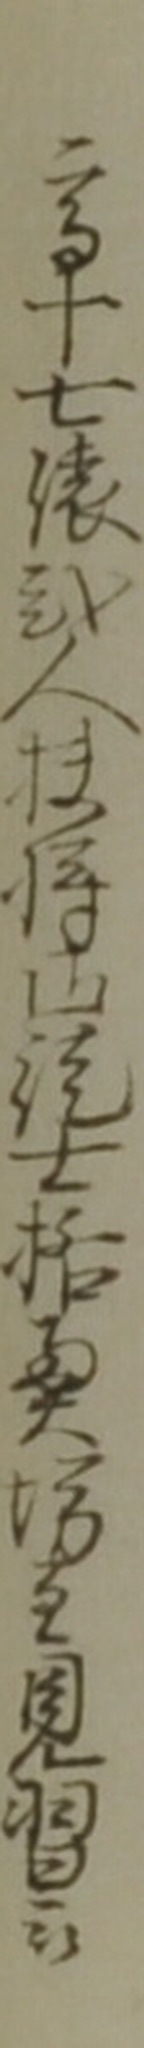高十七俵弐人扶持御徒士格奥坊主見習被
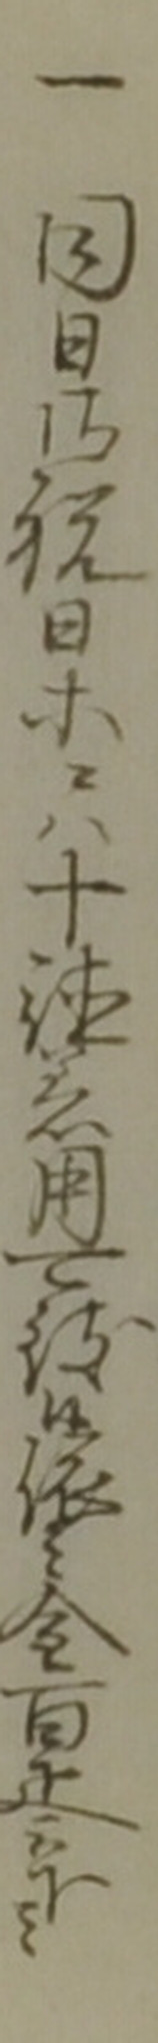一同日御祝日等ニハ十徳着用可致候依之金百疋被下之
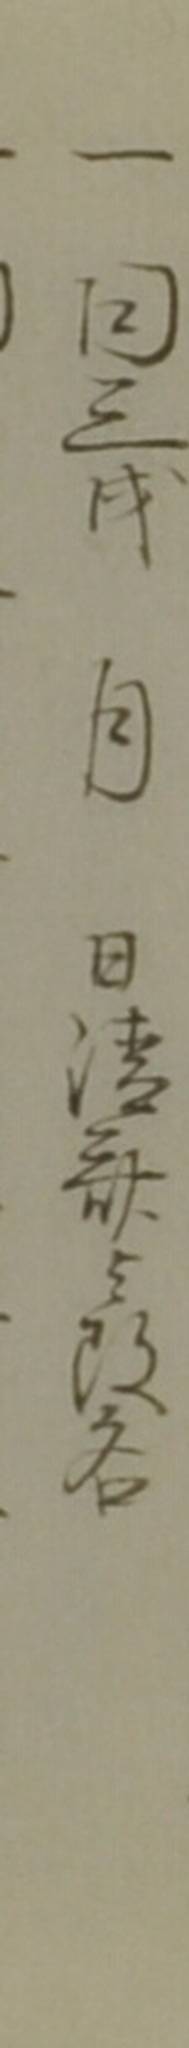一同三戌月日清斎与改名
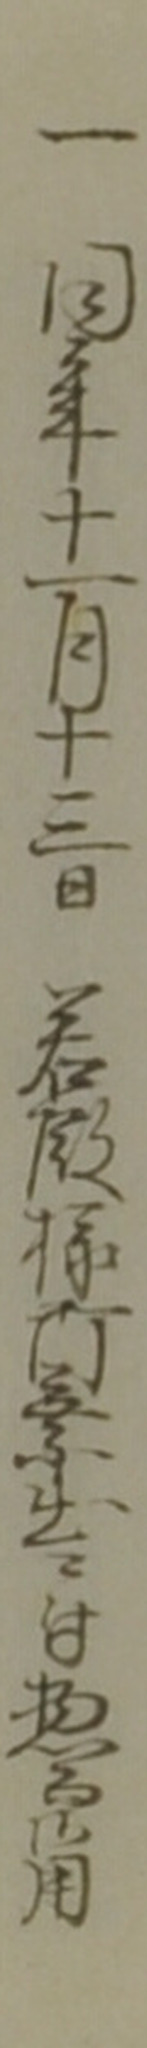一同年十一月十三日若殿様御乗出ニ付惣而御用
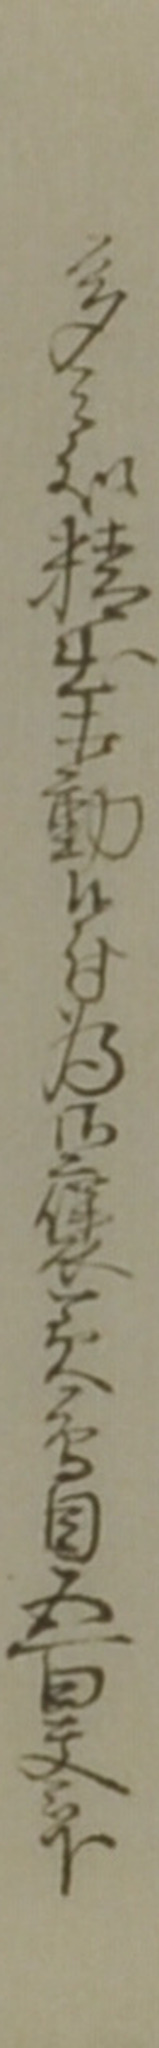多之処精出相勤候付為御褒美鳥目五百文被下
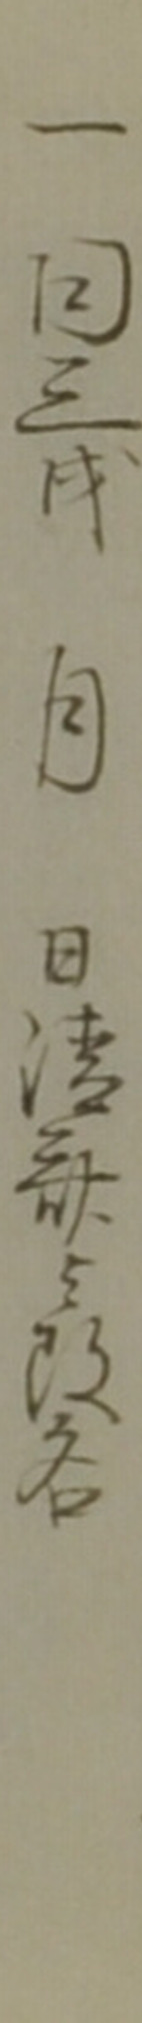一同三戌月日清斎与改名
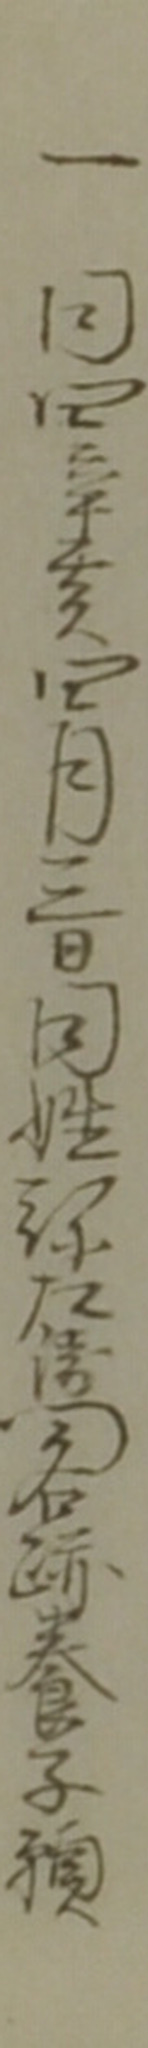一同四辛亥四月三日同姓弥左衛門名跡養子願
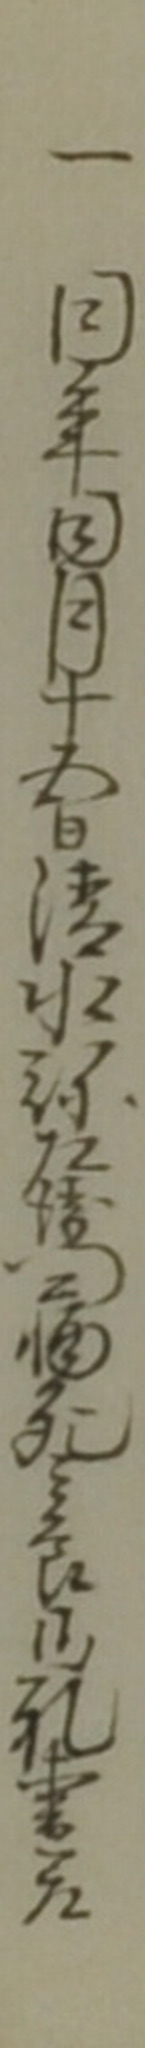一同年同月十五日清水弥左衛門病死之節御祝書差
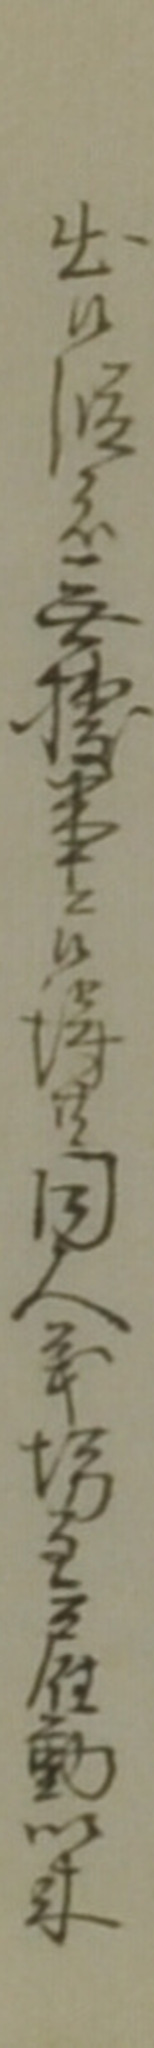出候段者無拠事ニ候得共同人義坊主雇勤以来
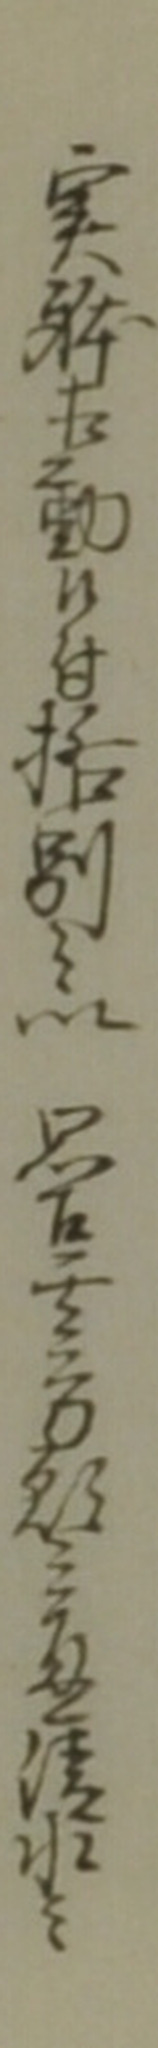実躰相勤候付格別之以思召其方願之通清水之
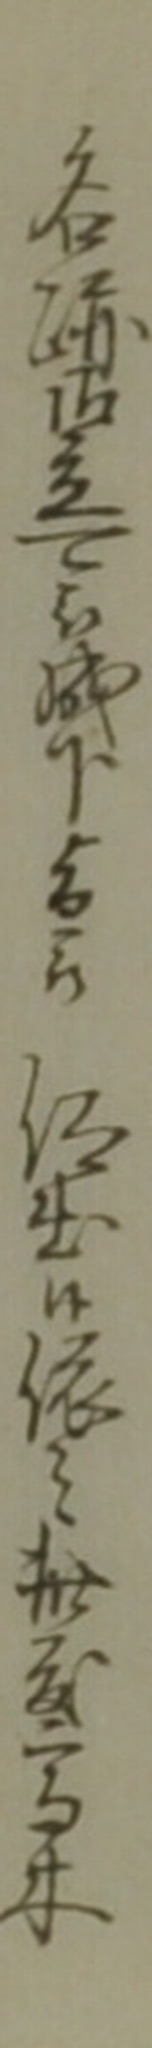名跡御立可被成下旨被仰出候依之此度馬木
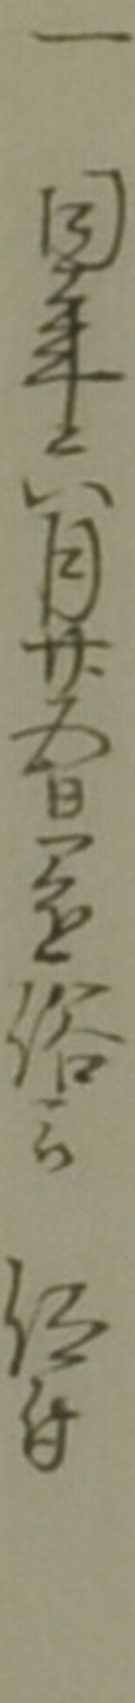一同年六月廿五日還俗被仰付
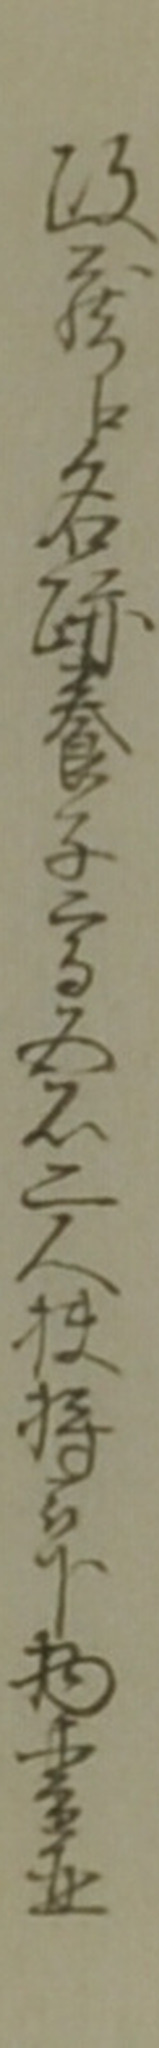政蔵江名跡養子高五石二人扶持被下物書並
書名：無足諸士勤仕録（七）
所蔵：伊那市立高遠町図書館・合同会社AMANE
